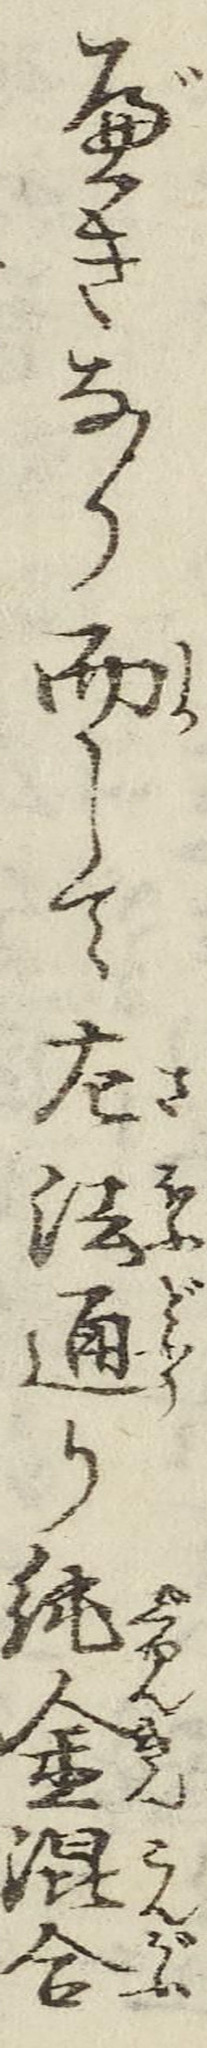べきなり而して左法通り純金混合
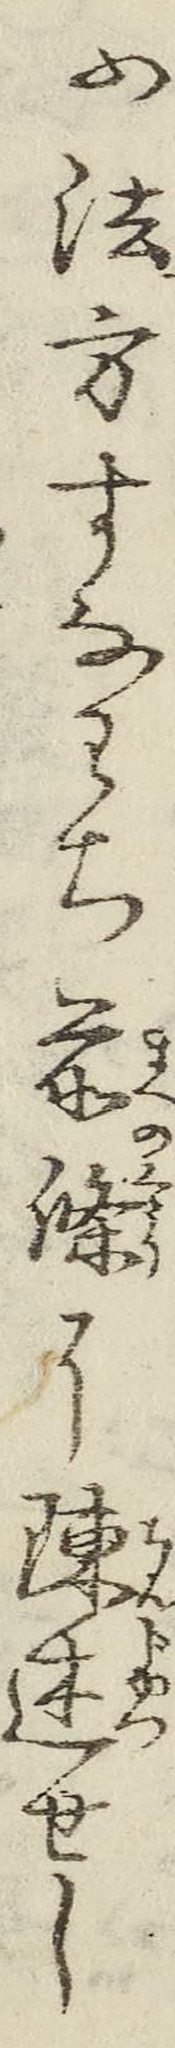の法方すなわち前條に陳述せし
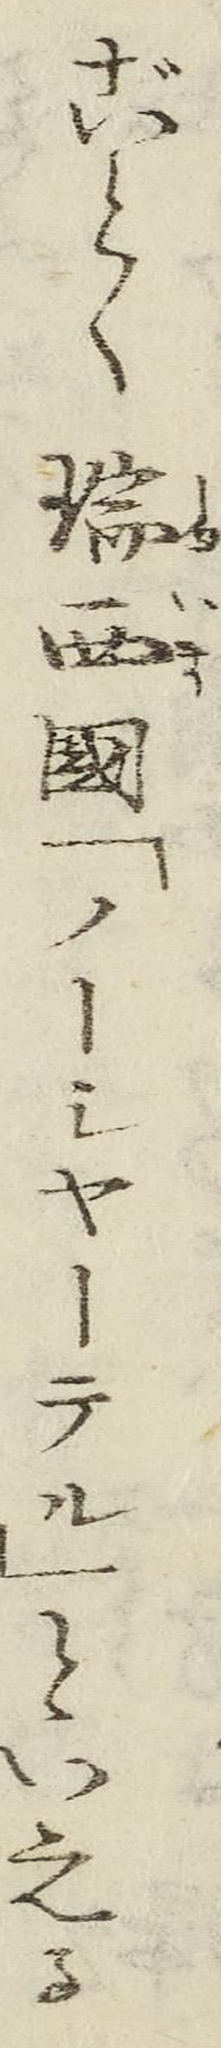ごとく瑞西国「ノーシヤーテル」といえる
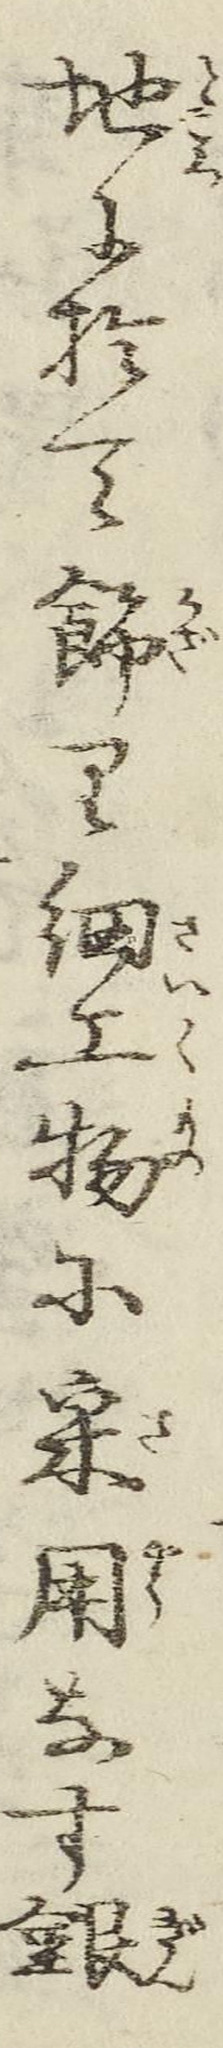地に於て飾り細工物に采用なす銀
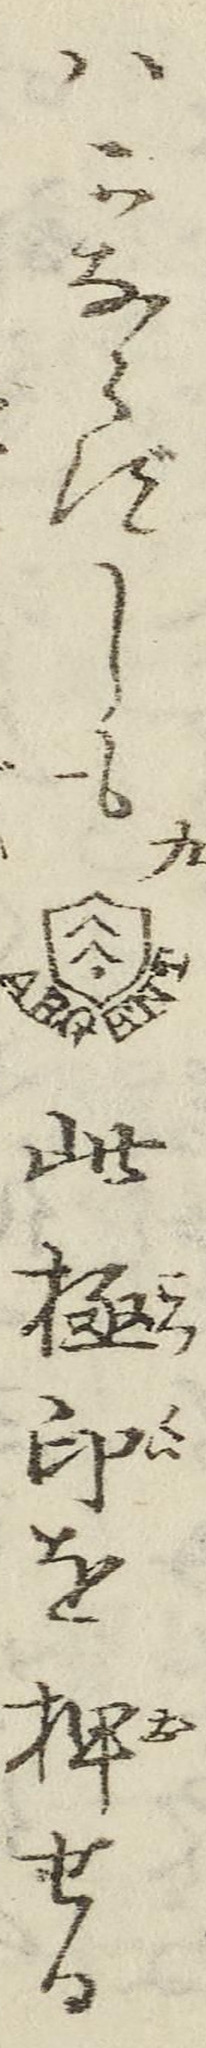はかならずしも九此極印を押せる
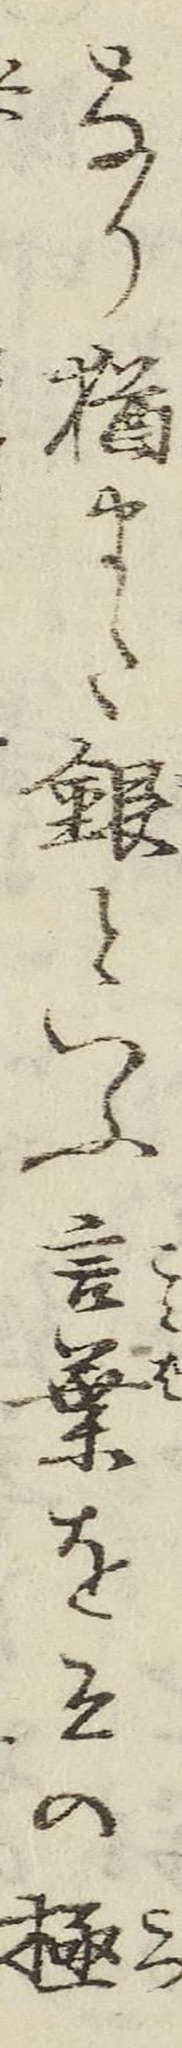なり猶また銀といふ言葉をその極
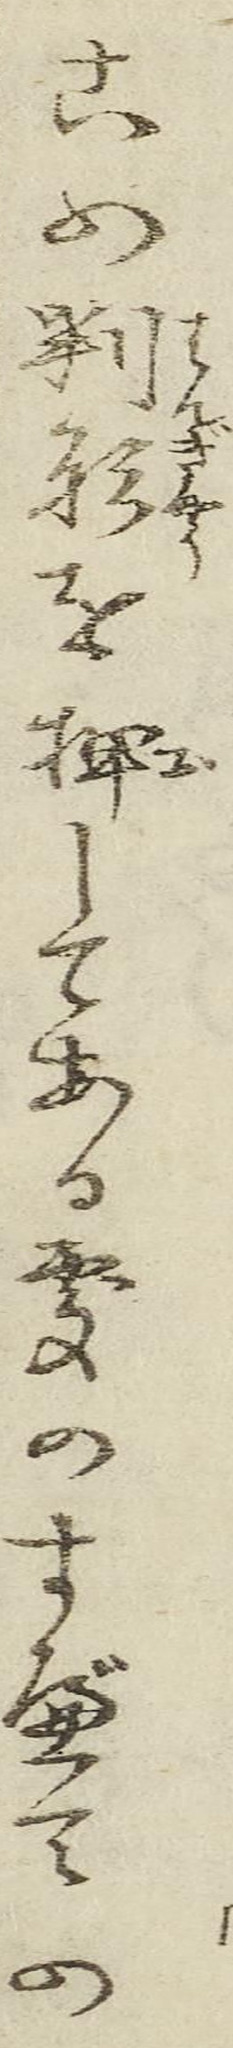この判形を押してある処のすべての

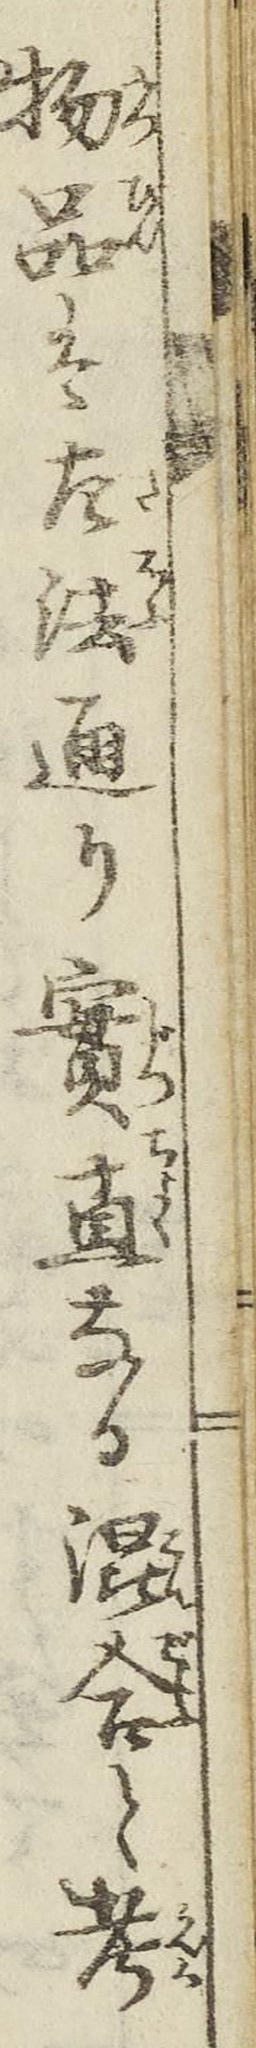物品は左法通り実直なる混合と考
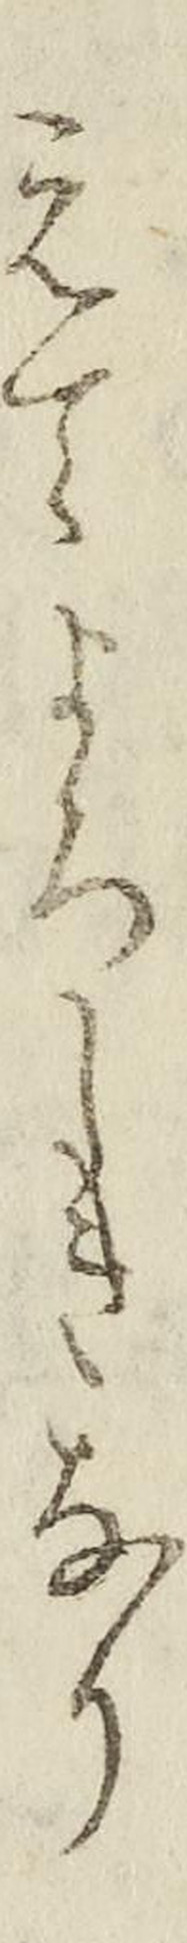えてよろしきなり
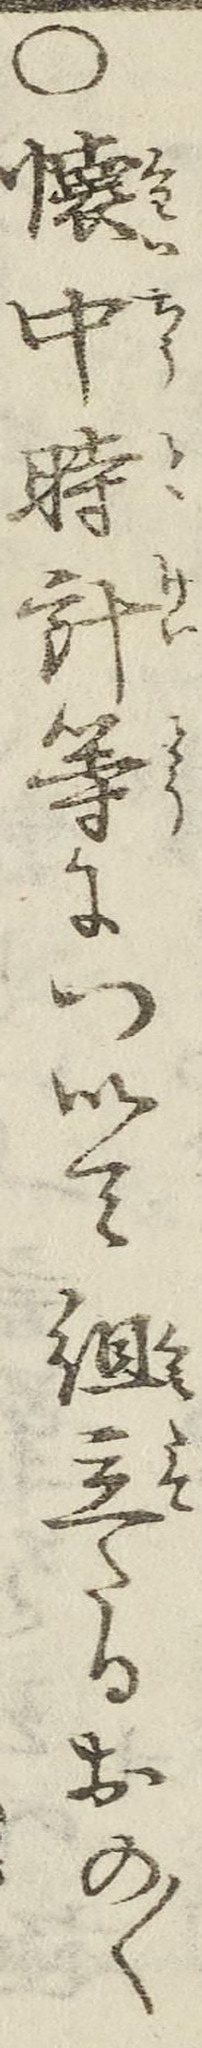〇懐中時計等について組立たるおの〳〵
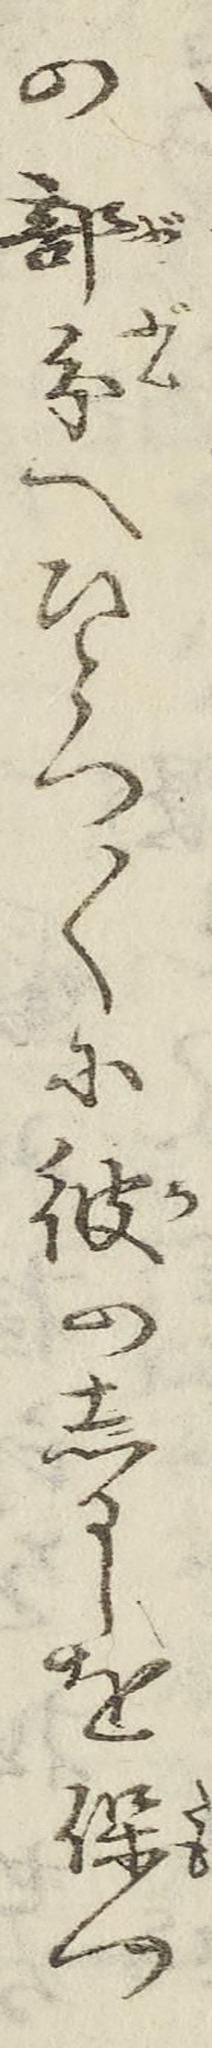の部分へひとつ〳〵に彼のしるしを保つ
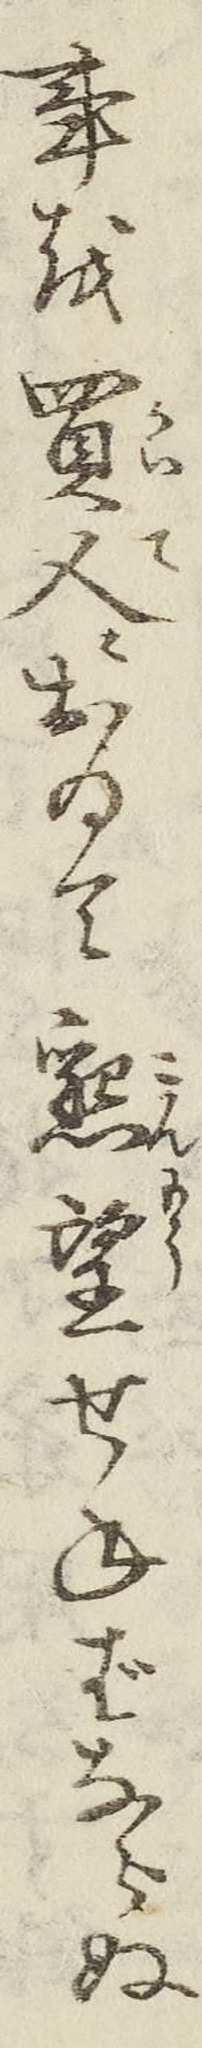事を買手ニおゐて懇望せねばならぬ
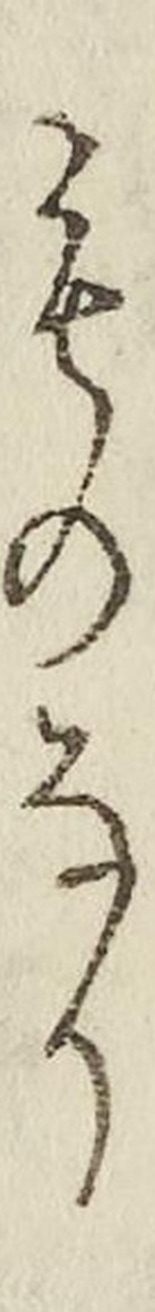ものなり
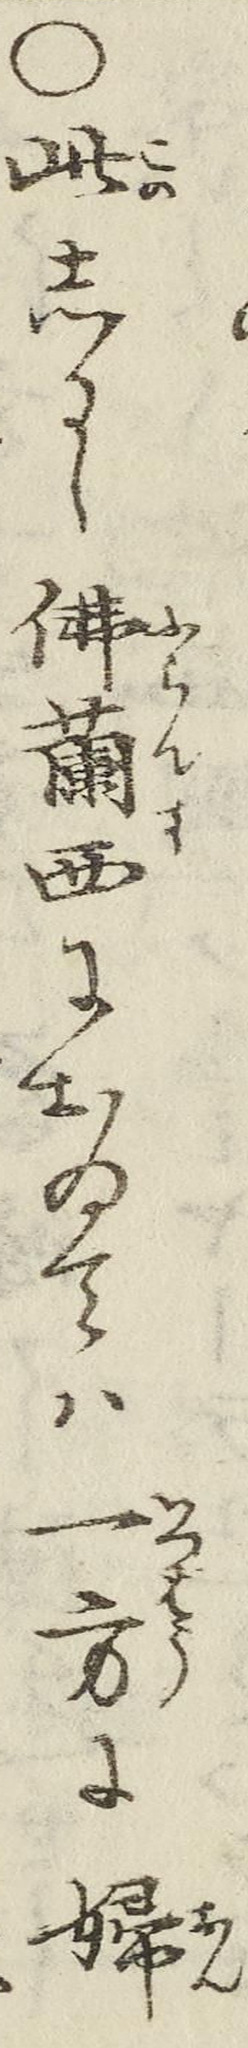〇此しるし仏蘭西におゐては一方に婦
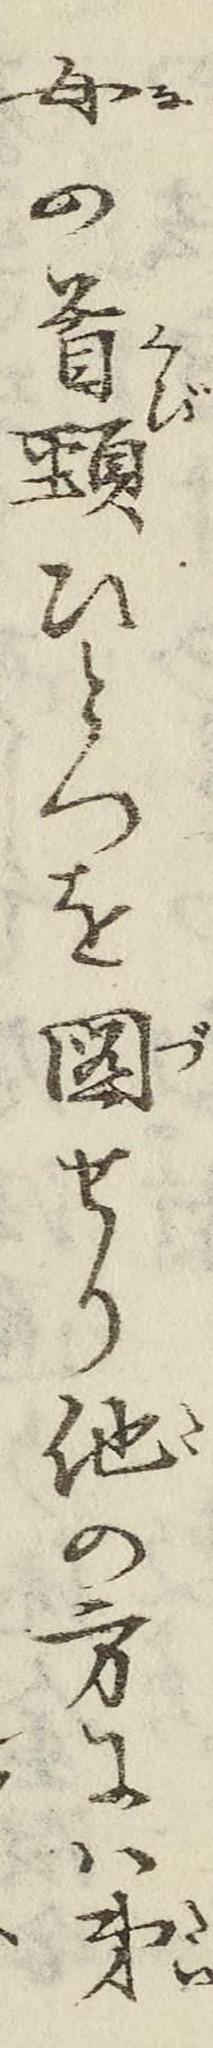女の首頸ひとつを図せり他の方には第
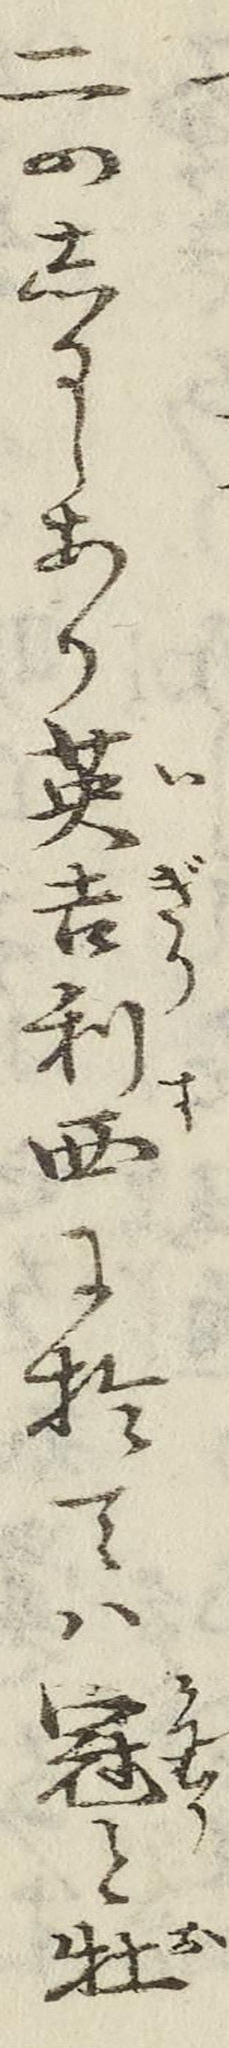二のしるしあり英吉利西に於ては冠と牡
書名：[時計に関する冊子]
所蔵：東京大学地震研究所図書室 Earthquake Research Institute Library, The University of Tokyo, JAPAN
